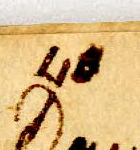40
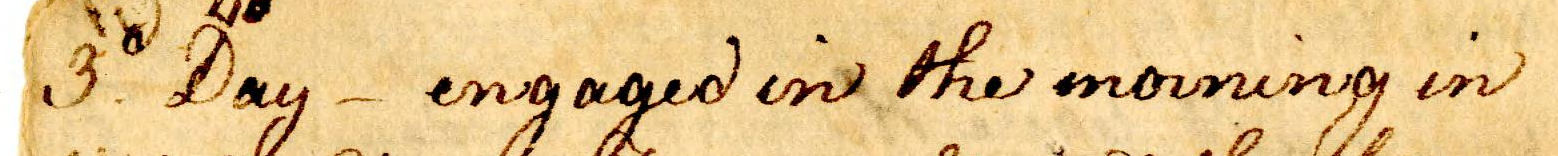3^d Day- engaged in the morning in
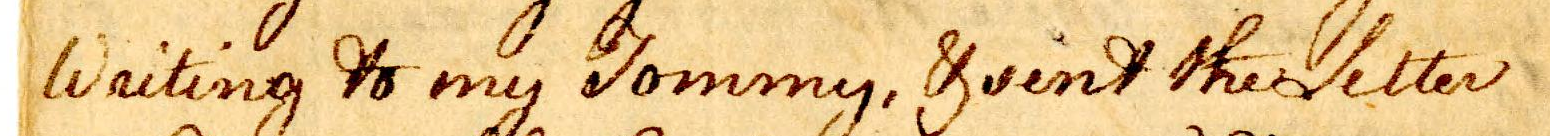Writing to my Tommy, & sent the Letter
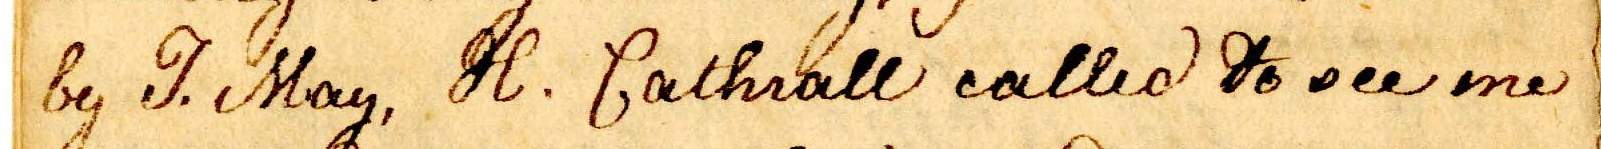by T. May, H. Cathrall called to see me
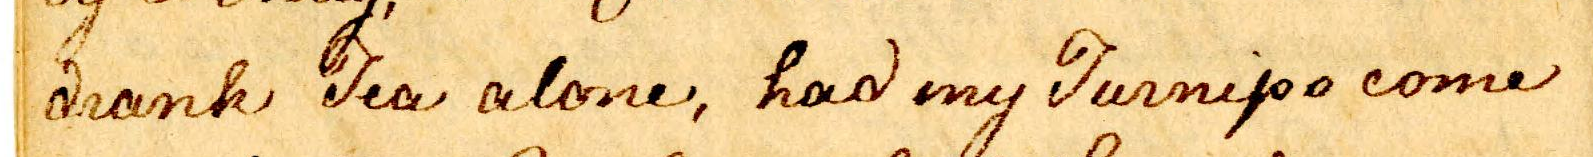drank Tea alone, had my Turnips come
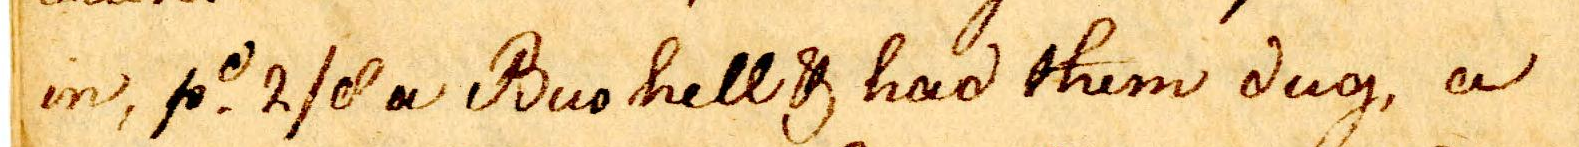in, p^e. 2s8 a Bushell & had them dug, a
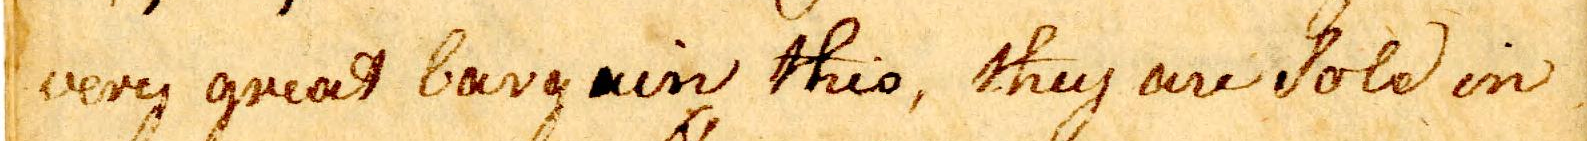very great bargain this, they are Sold in
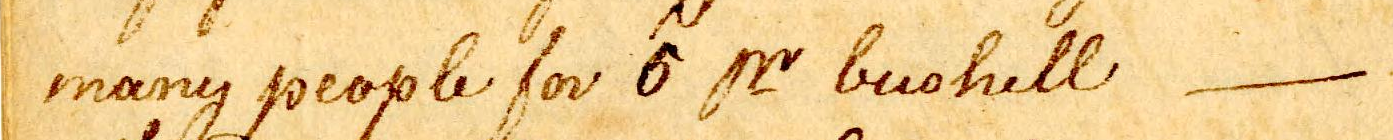many people for 5 per bushell-
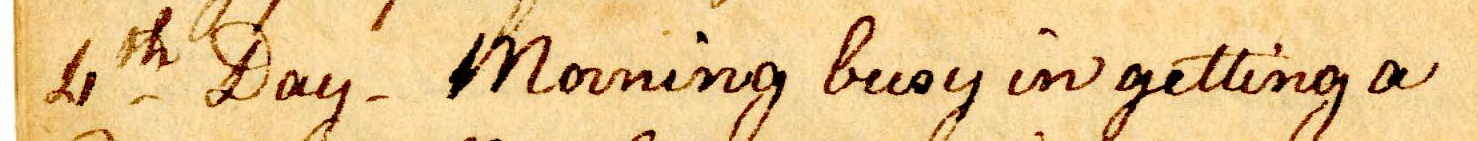4^th Day- Morning busy in getting a
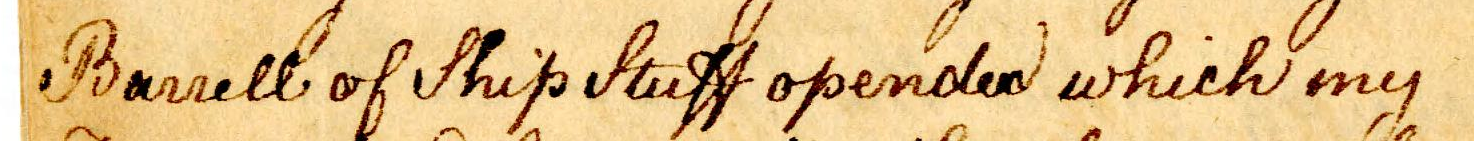Barrell of Ship Stuff opended which my
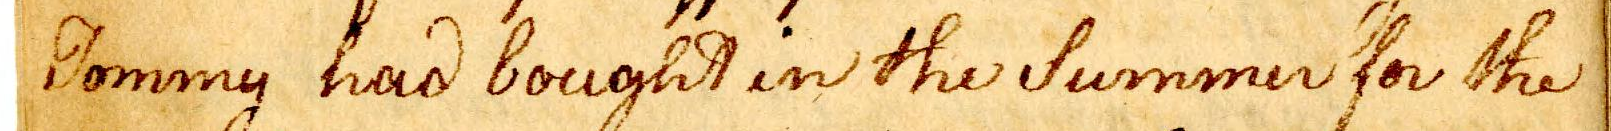Tommy had bought in the Summer for the
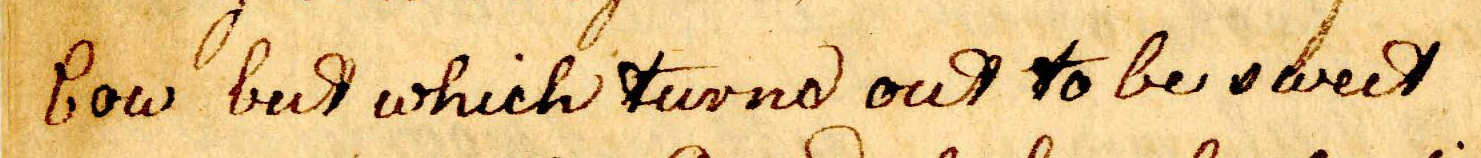Cow but which turnd out to be sweet
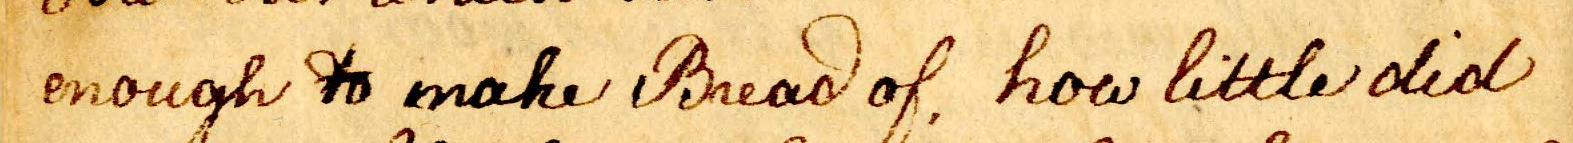enough to make Bread of, how little did
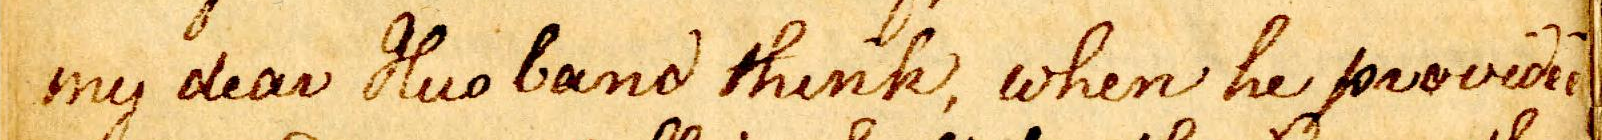my dear Husband think, when he provided
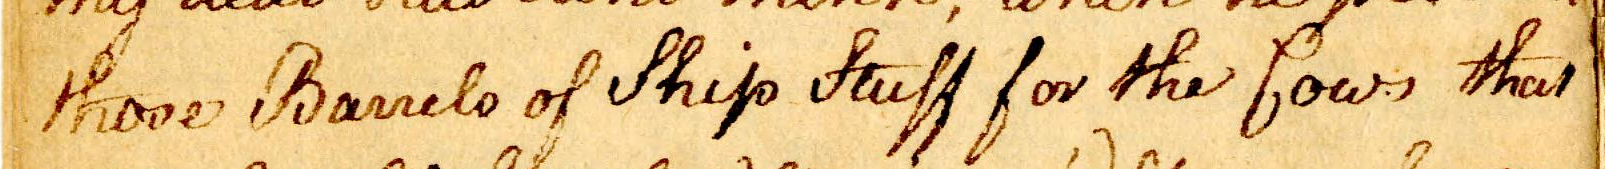those Barrels of Ship Stuff for the Cows that
